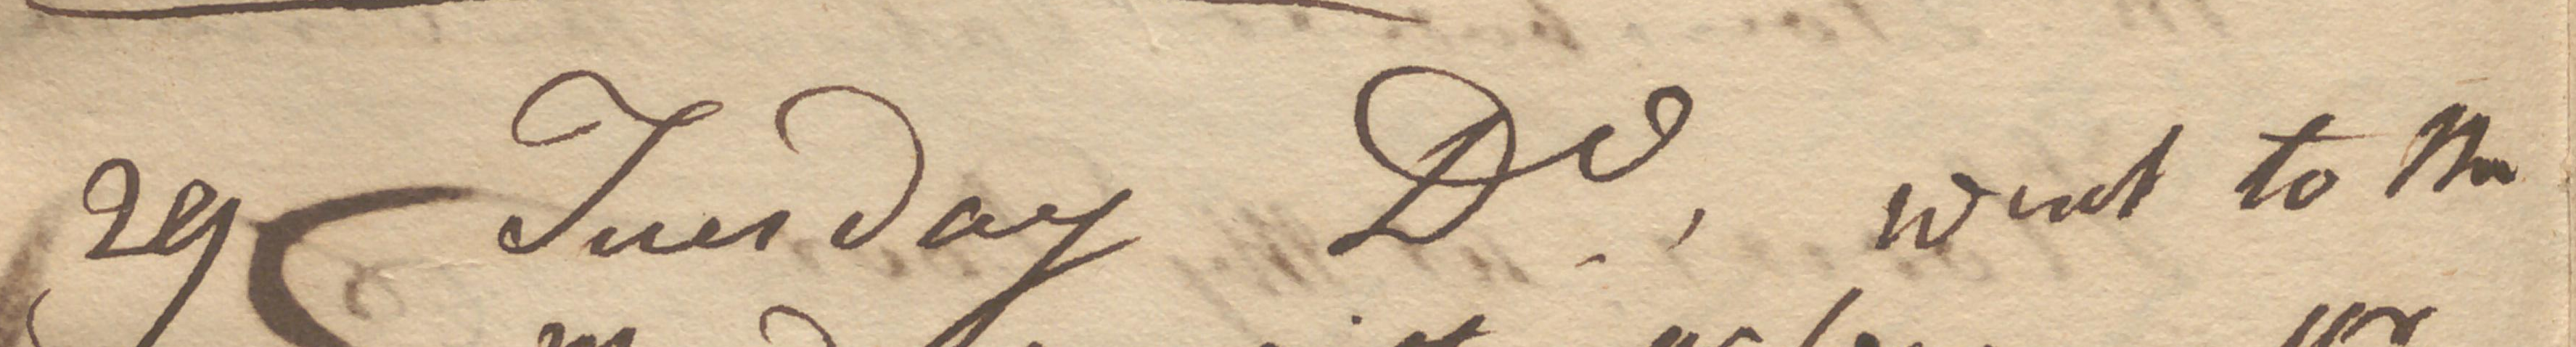29 Tuesday D^o, went to the
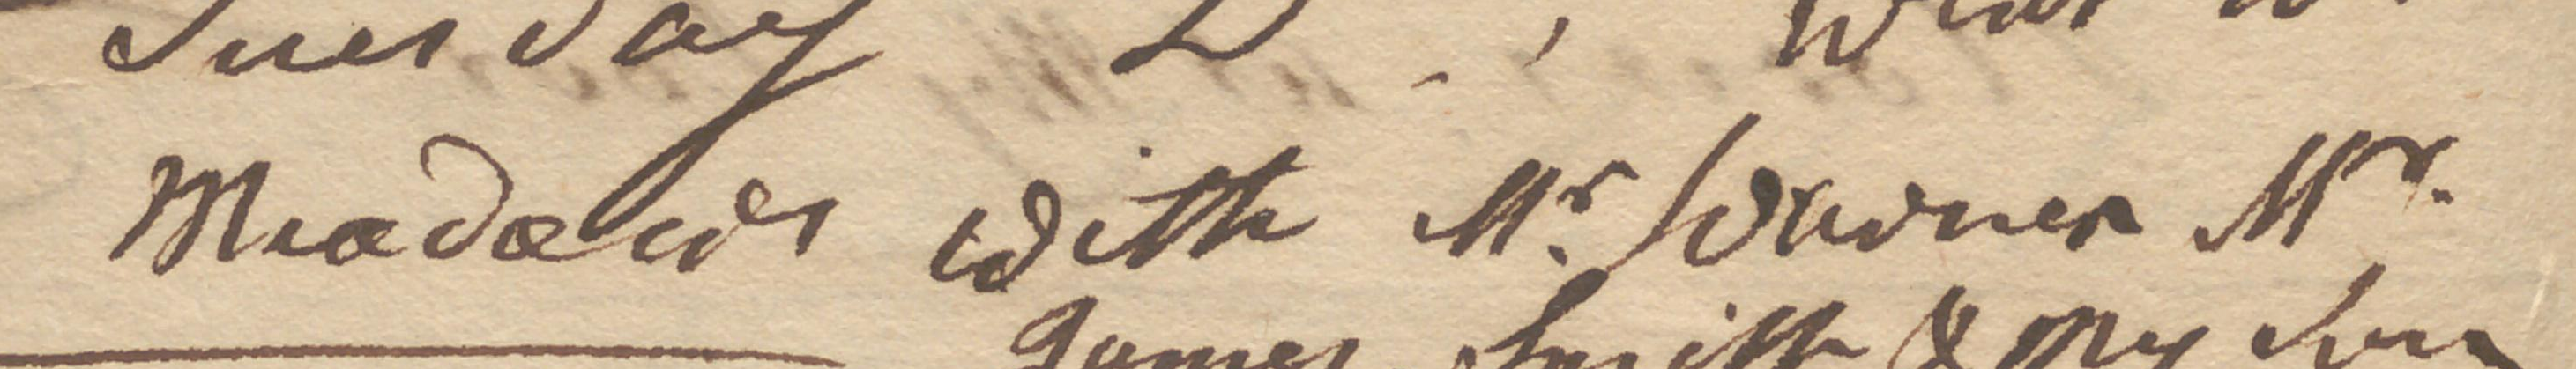Meadows with M^r. Warner M^r.
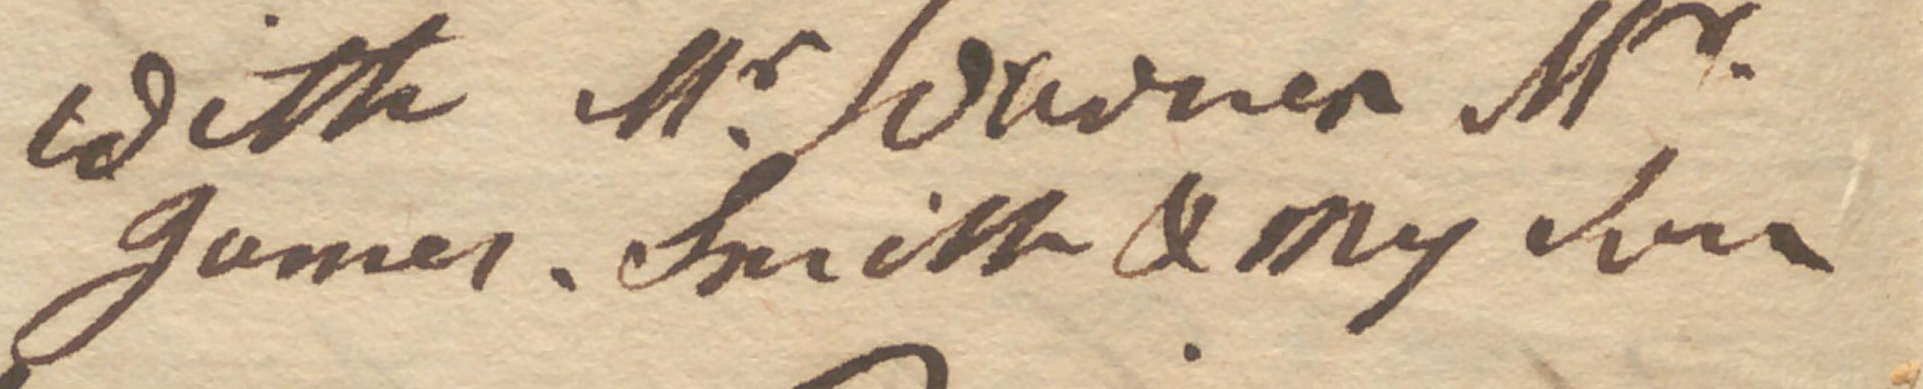James. Smith & My Son
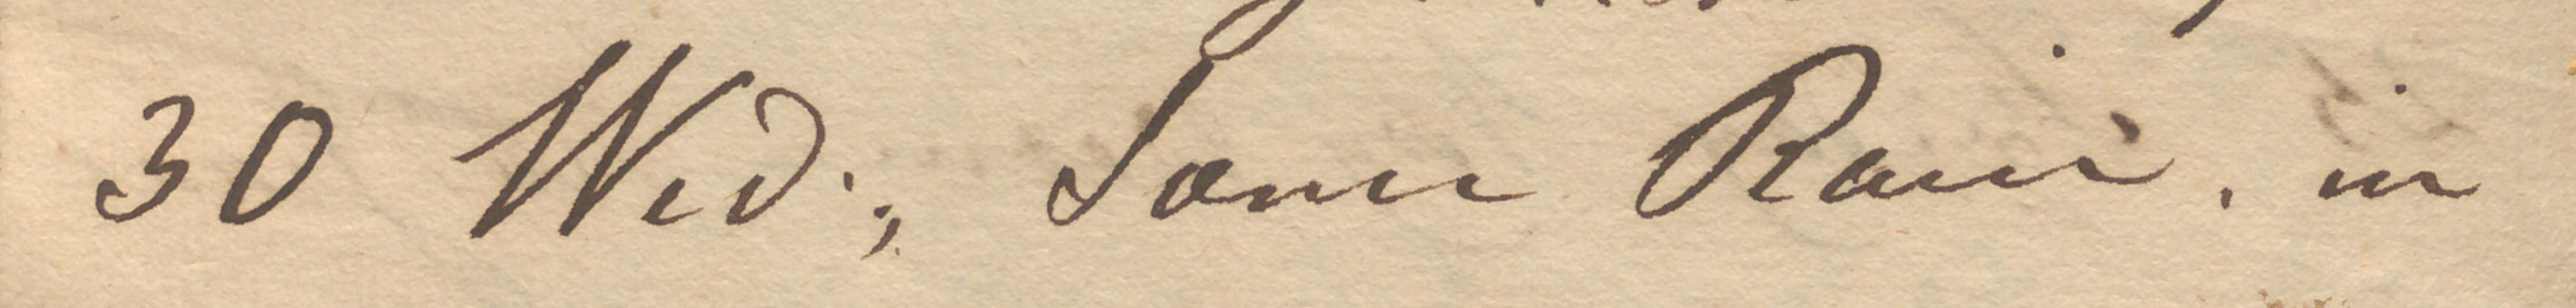30 Wed. Some Rain, in
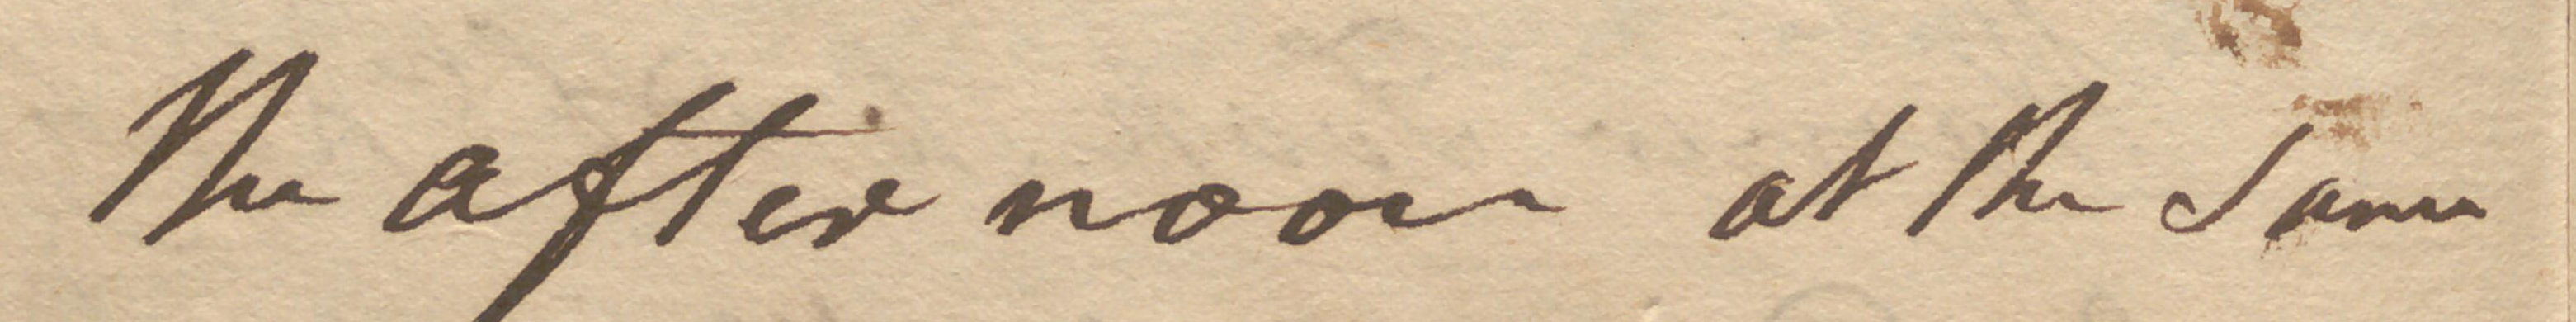the afternoon at the Same
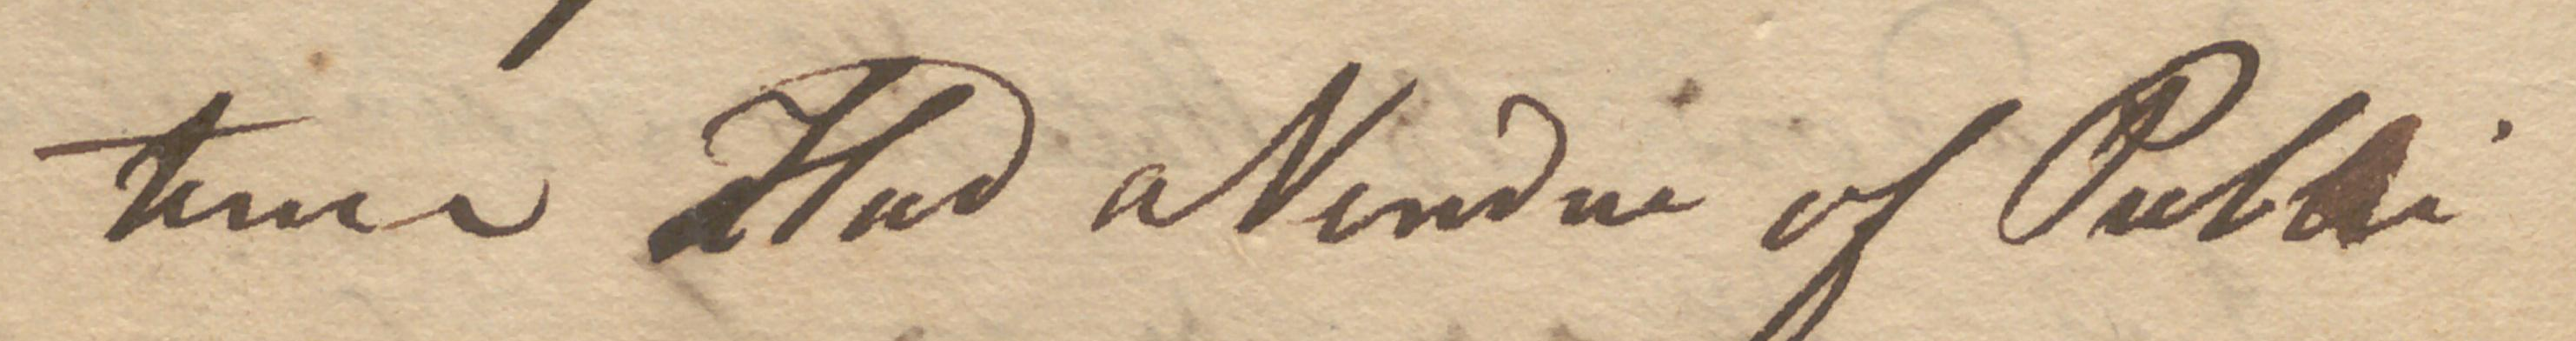time Had a Vendue of Public
